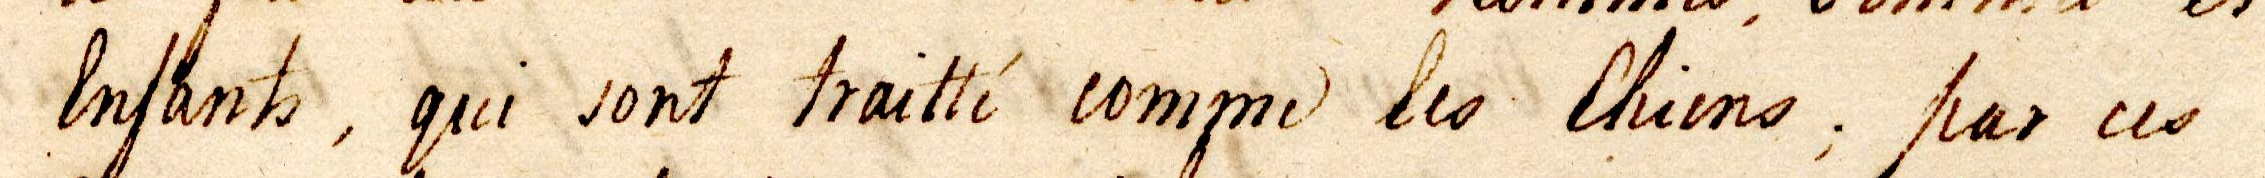Enfants qui sont traitté comme les Chiens; par ces
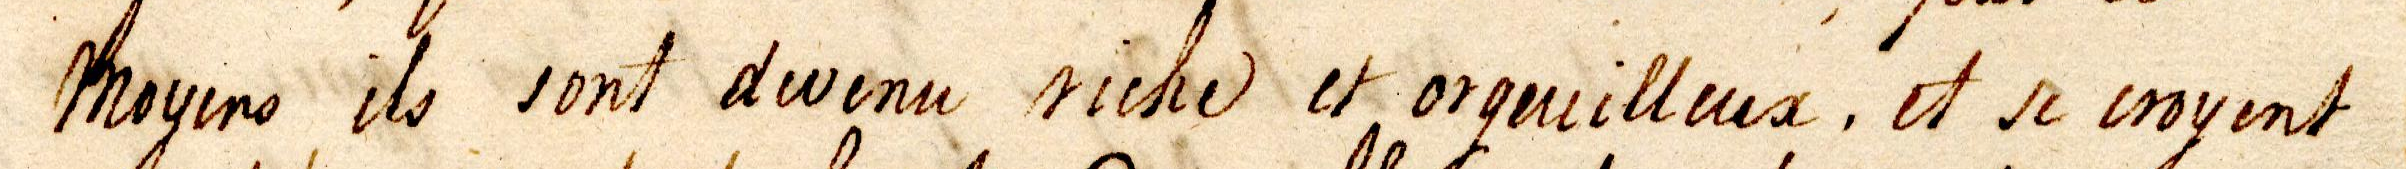Moyens ils sont devenus riche et orgeuilleux, et se croyent
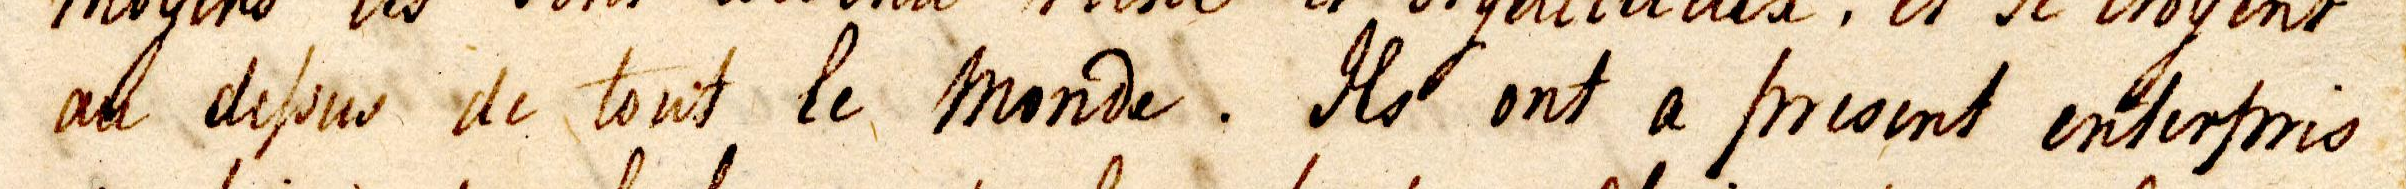au dessus de tout le Monde. Ils ont a present enternis
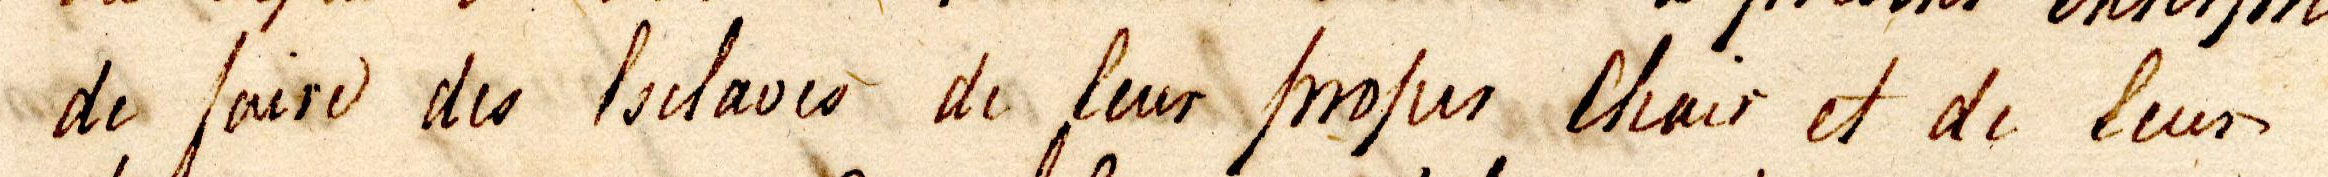de faire des Esclaves de leur proper Chair et de leur
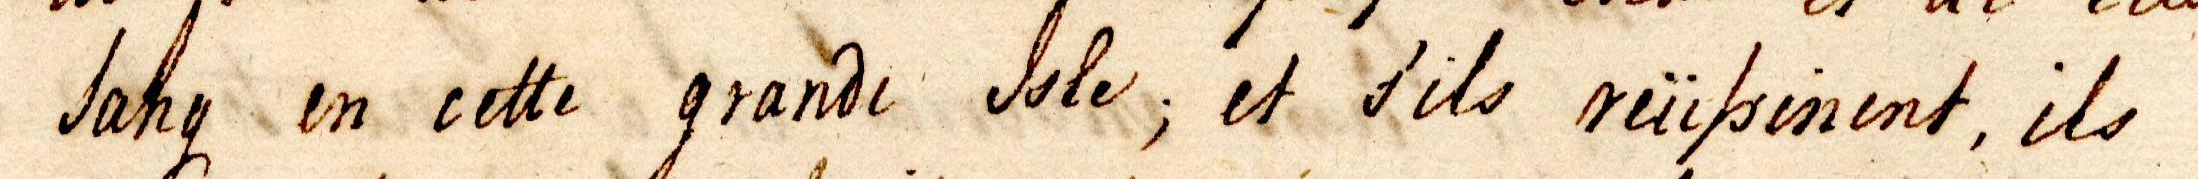Sang en cette grande Isle; et sils reüssenent, ils
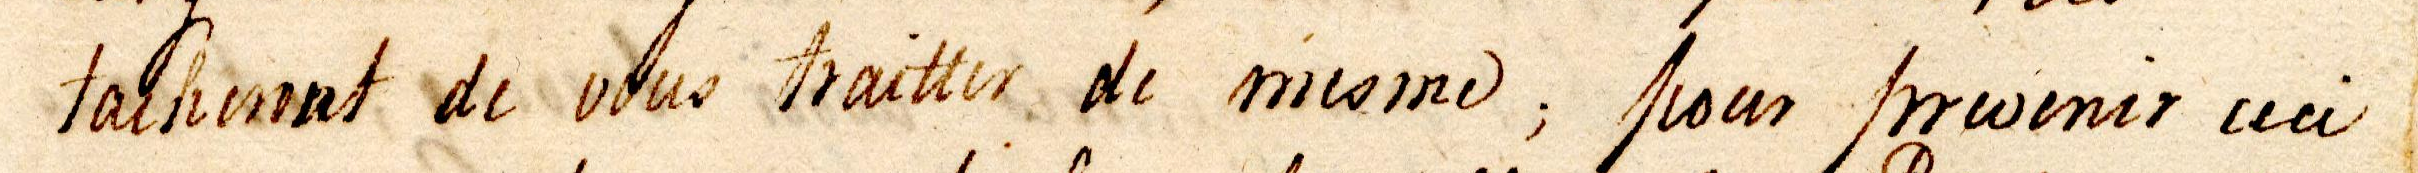tacheront vous traitter de mesme; pour prevenir ceci
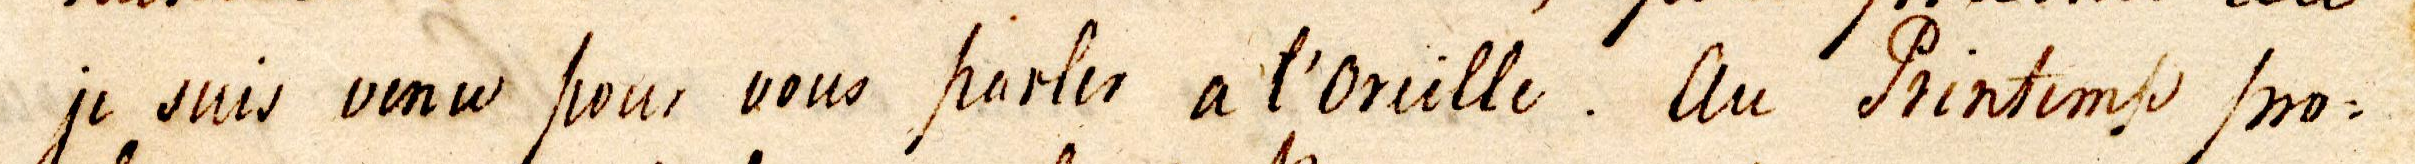je suis venu pour vous parler a l'Oreille. Au Printemp pro-
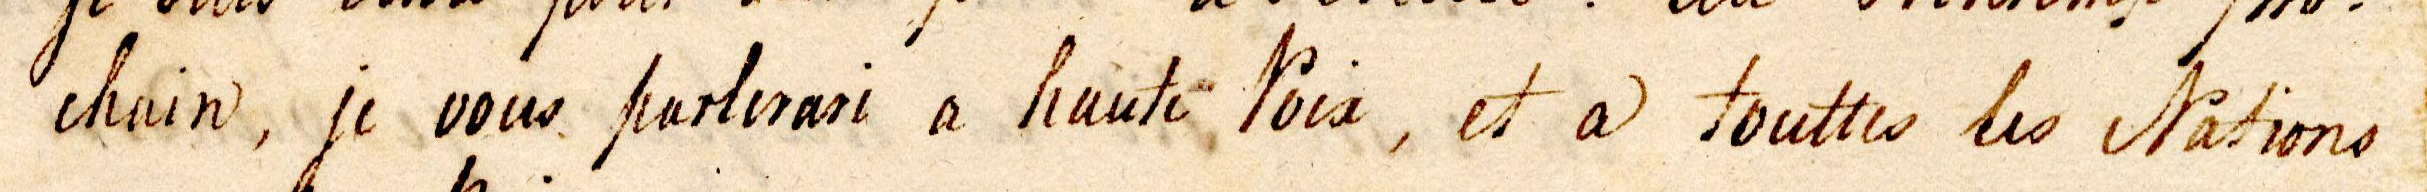chain, je vous parlerari a haute Voix, et a touttes les Nations
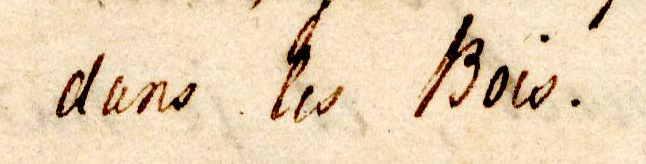dans les Bois.
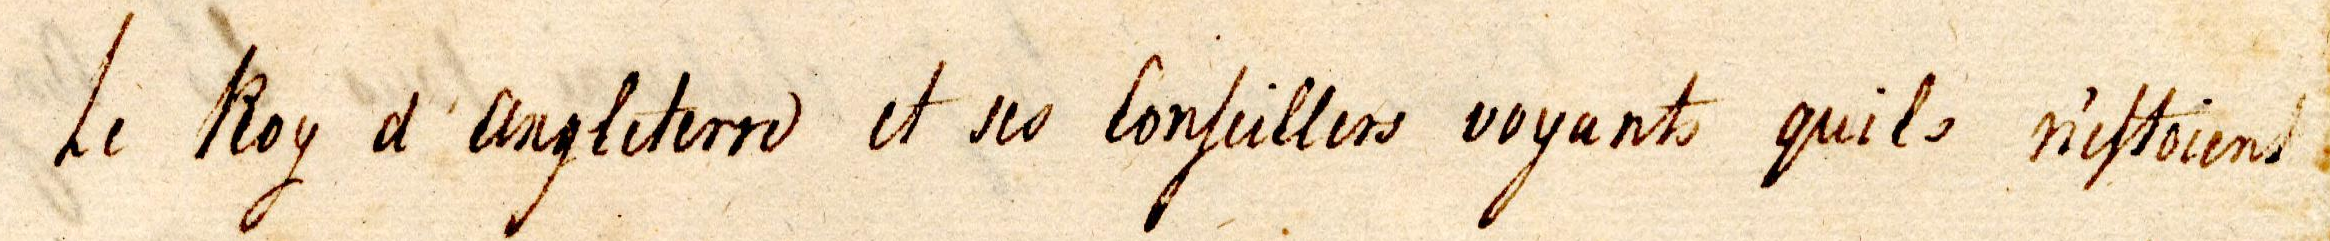Le Roy d'Angleterre et ses Conseillers voyants quils n'estoiens
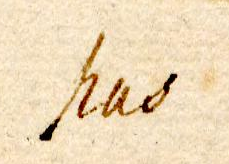pas
